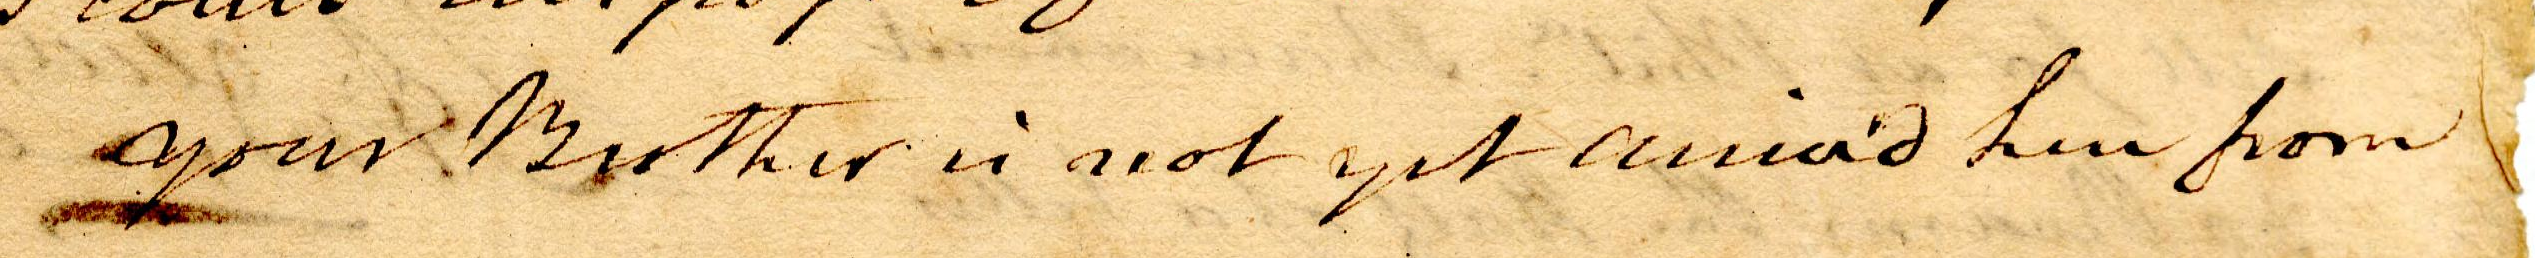your Brother is not yet arriv'd here from
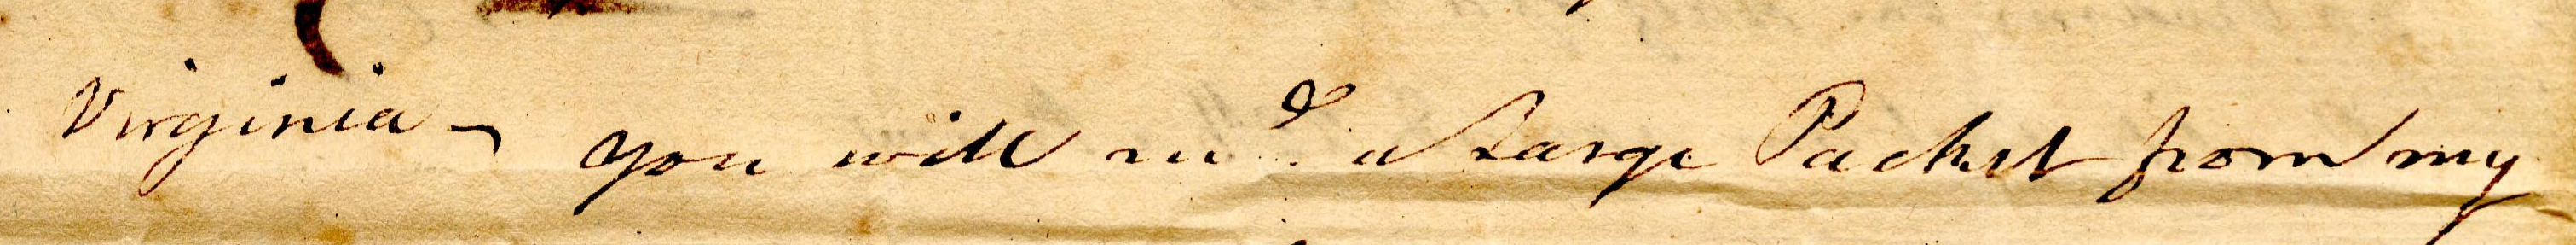Virginia- you will rec^e a Large Packet from my
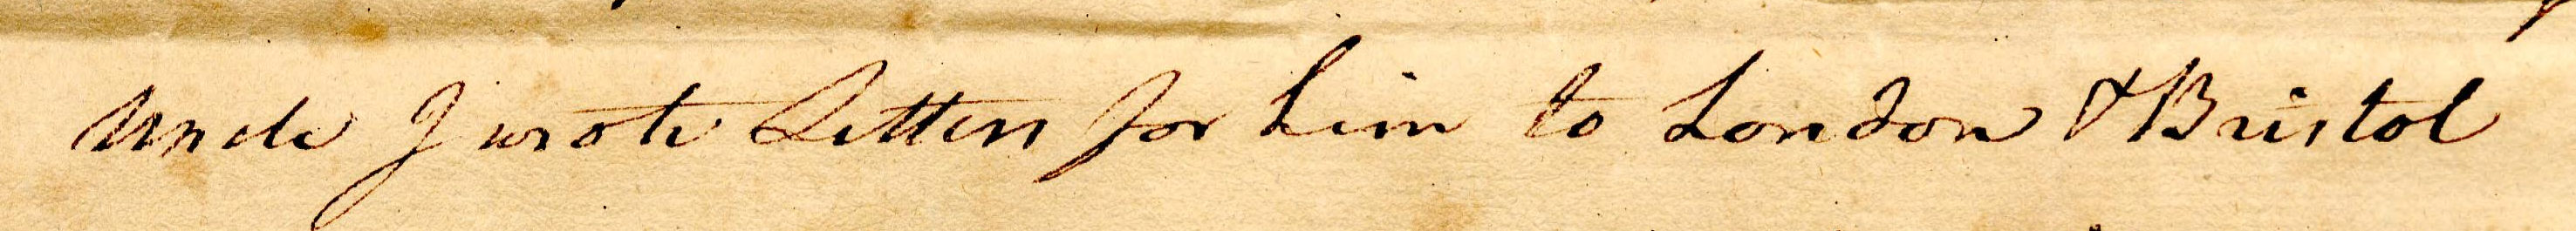Uncle I wrote Letters for him to London & Bristol
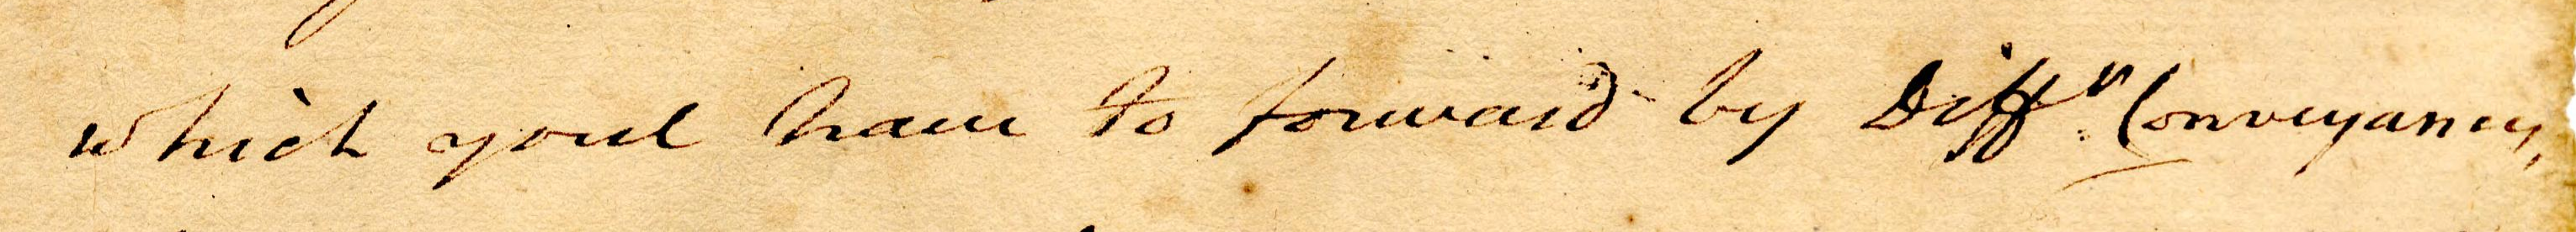which youl have to forward by Diff^t. Conveyance
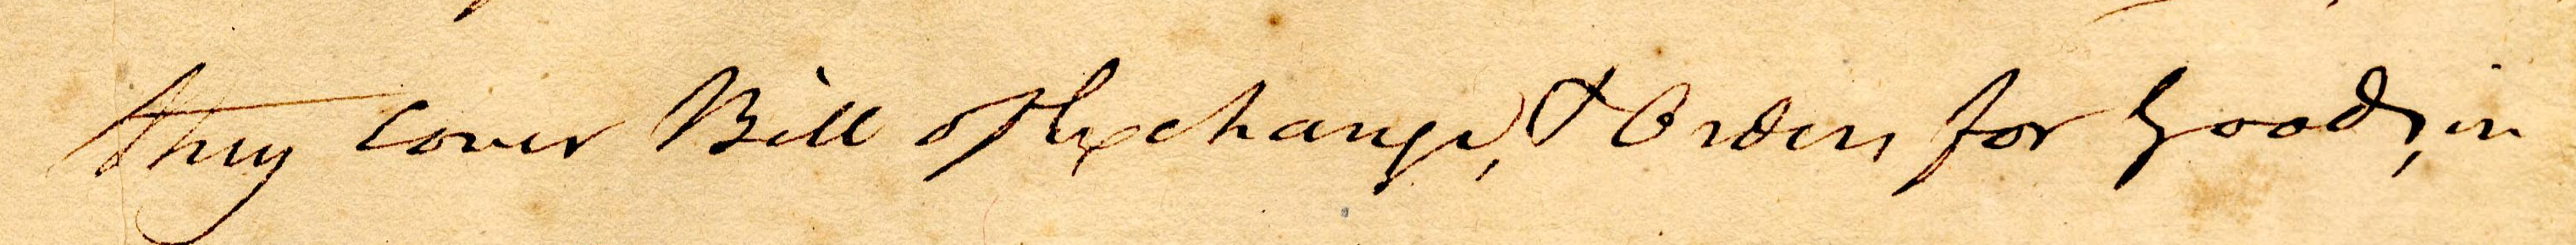they cover Bill of Exchange, & Orders for Goods, in
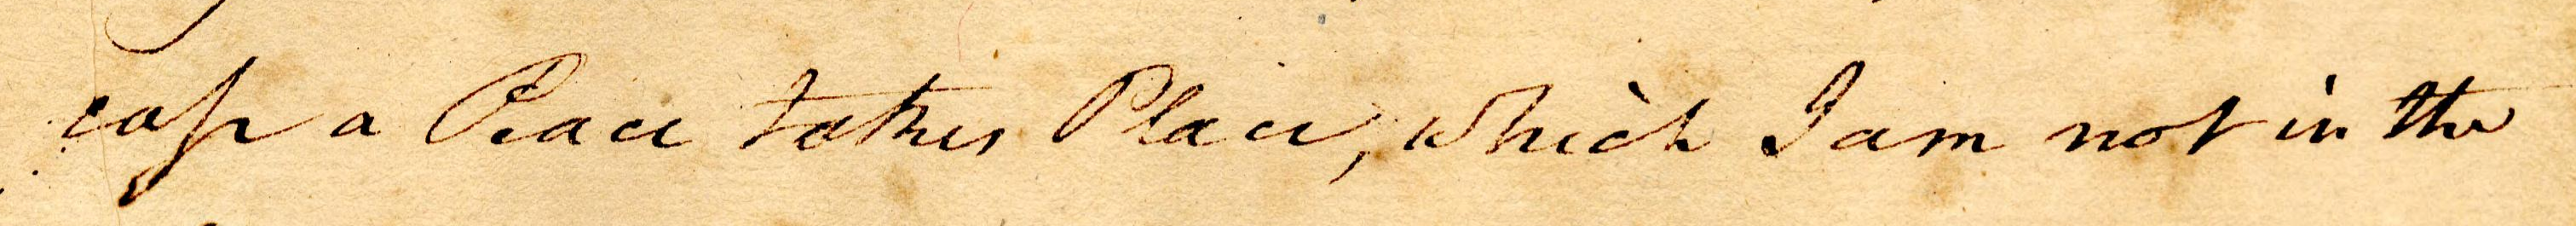case a Peace takes Place, which I am not in the
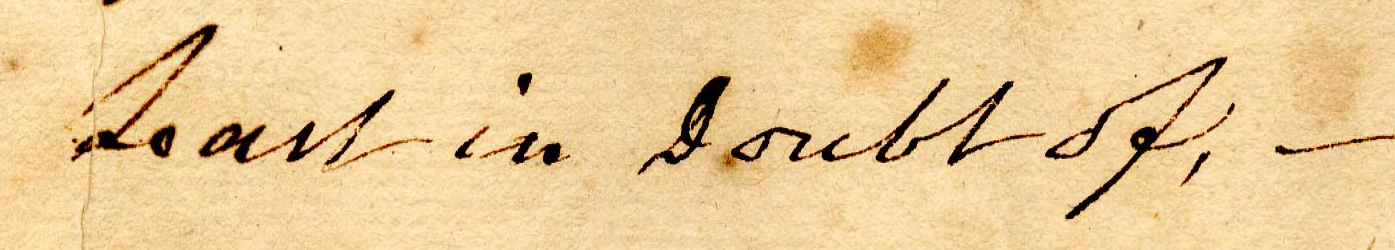Least in doubt of.-
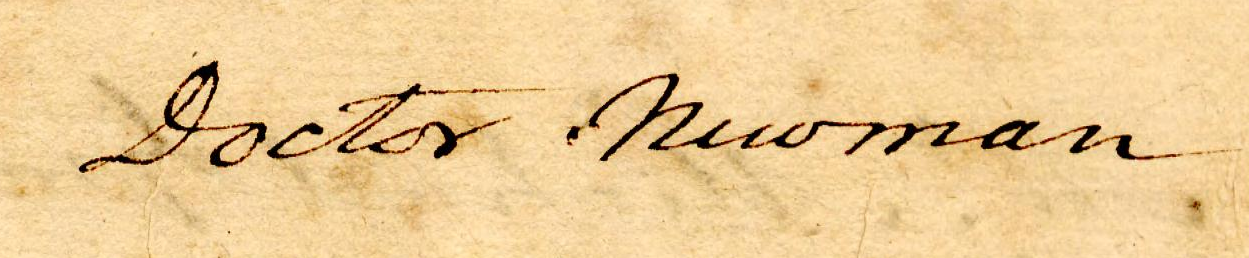Doctor. Newman
